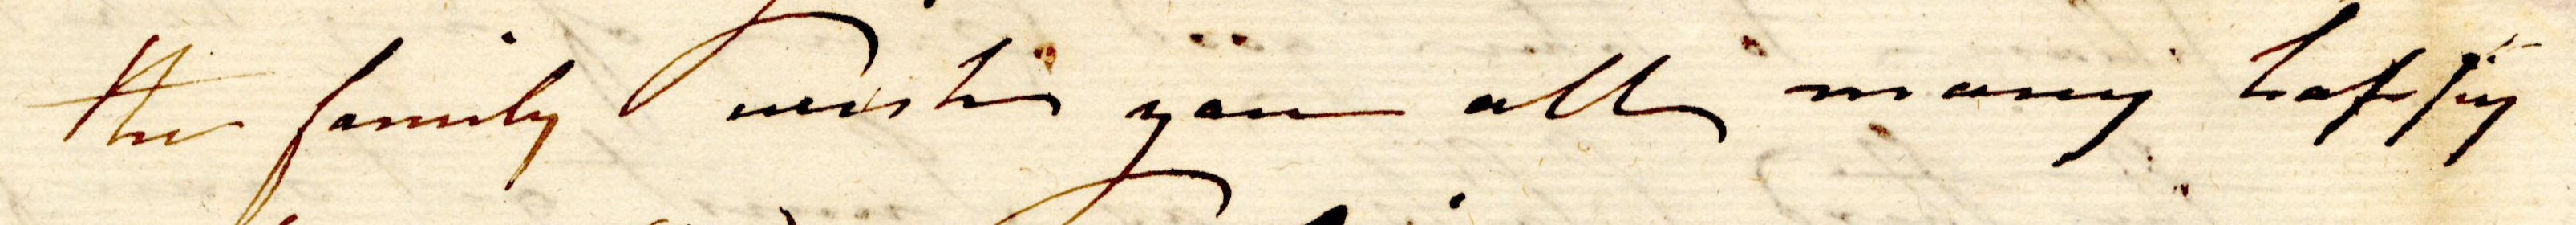the family Wish you all many happy
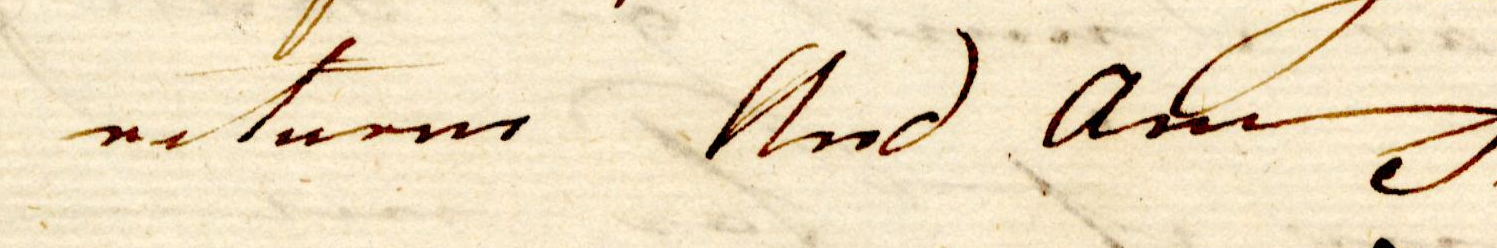returns And are
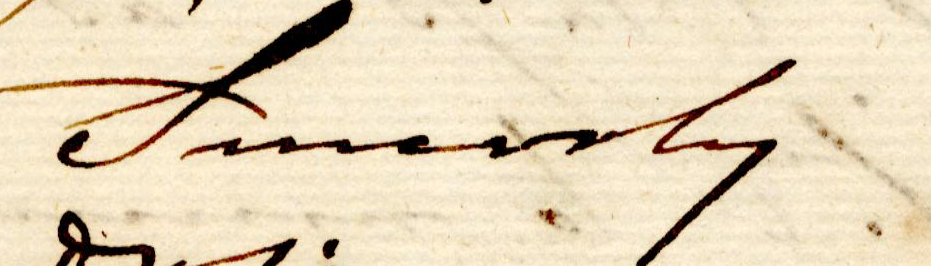Sincerly
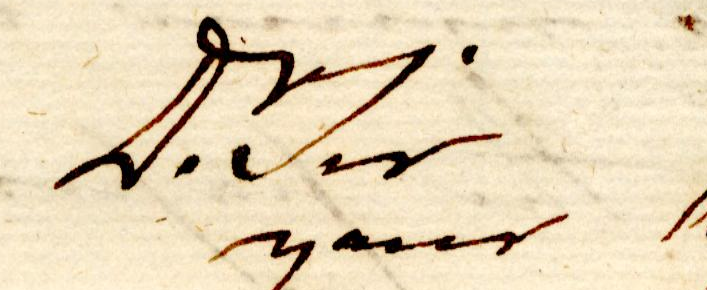D^r. Sir
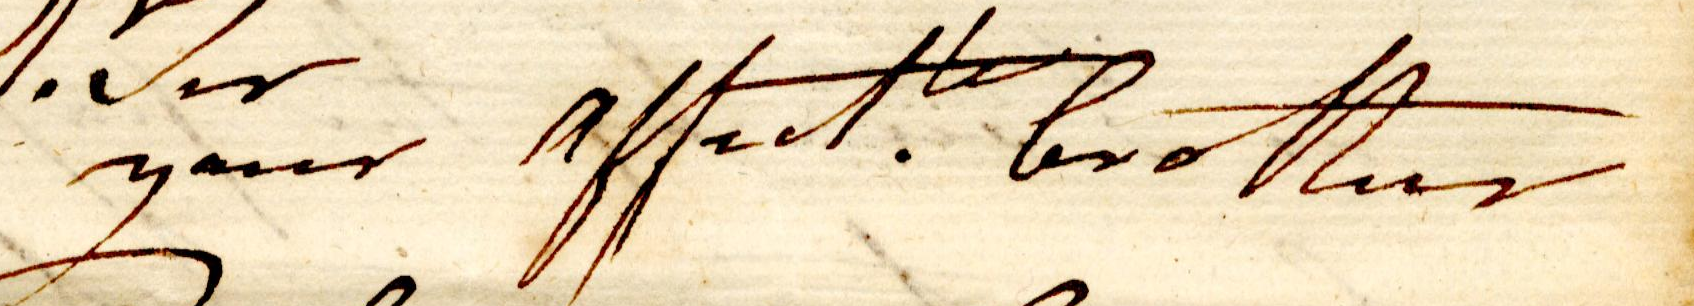your affect^te Brother
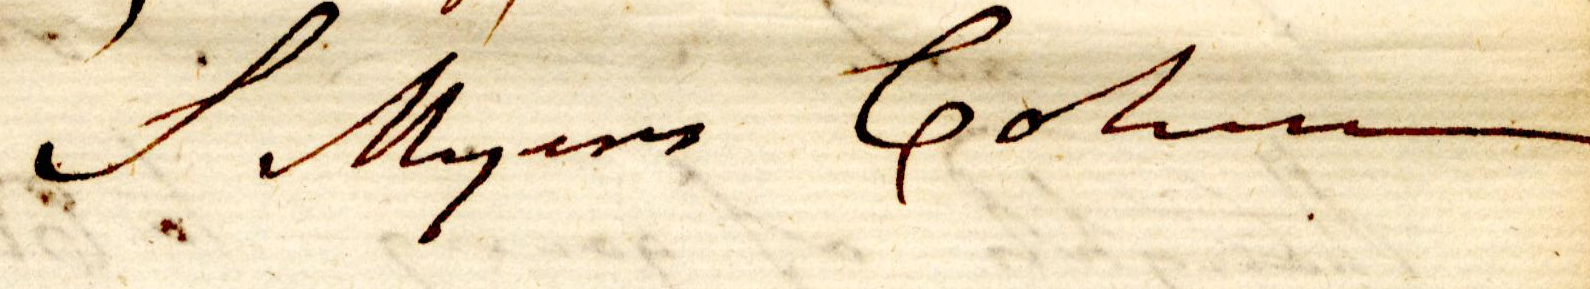S Myers Cohen
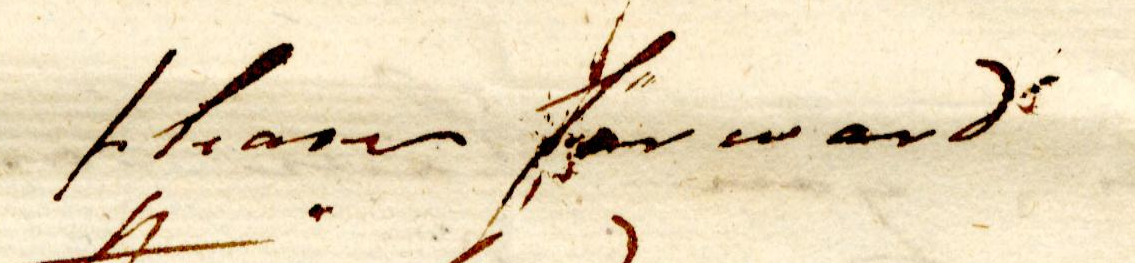please forward
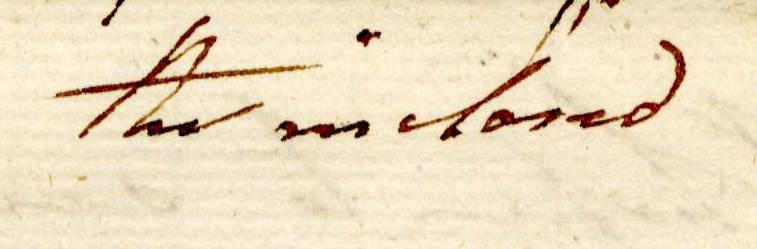the inclosed
